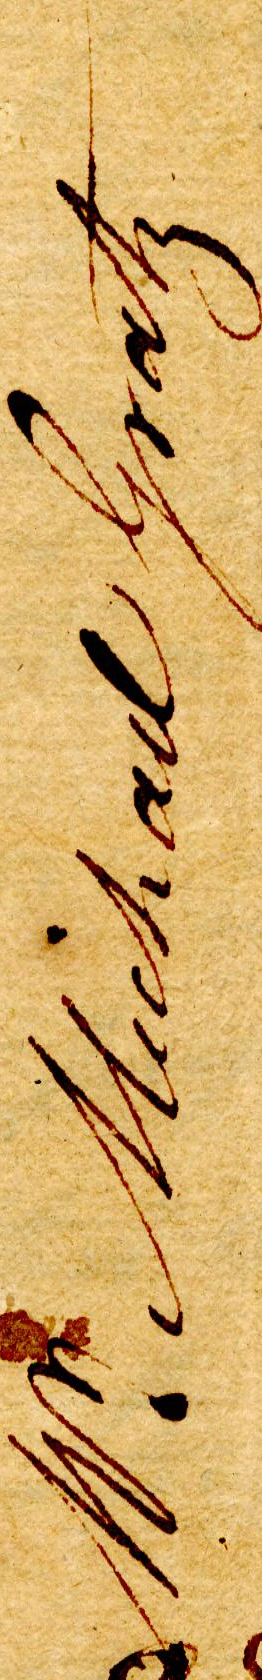M^r Michael Gratz
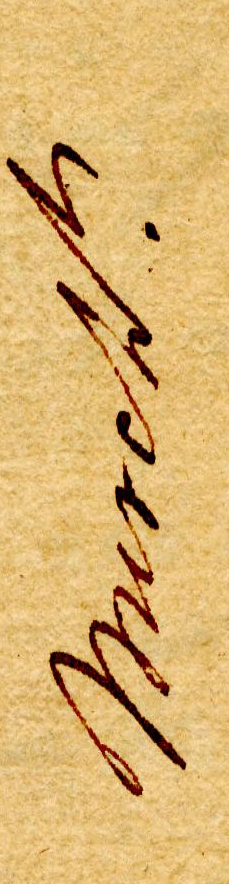Merch^t
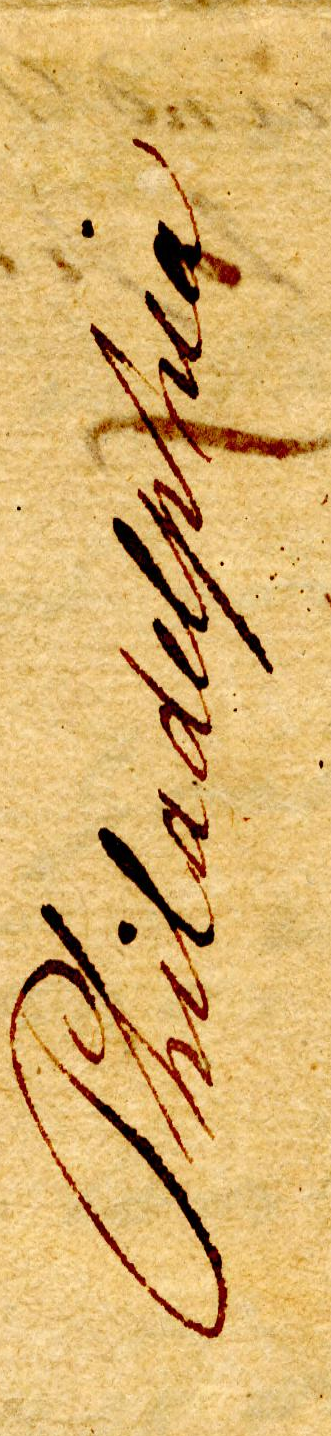Philadelphia
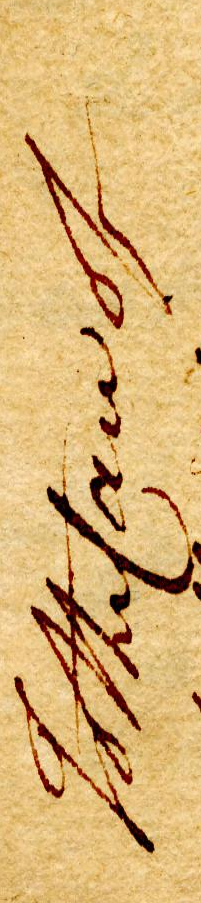per the care of
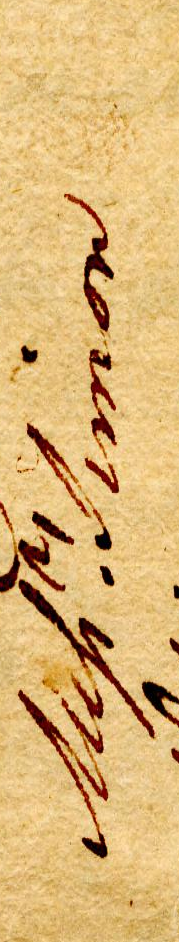Mich^l Simon
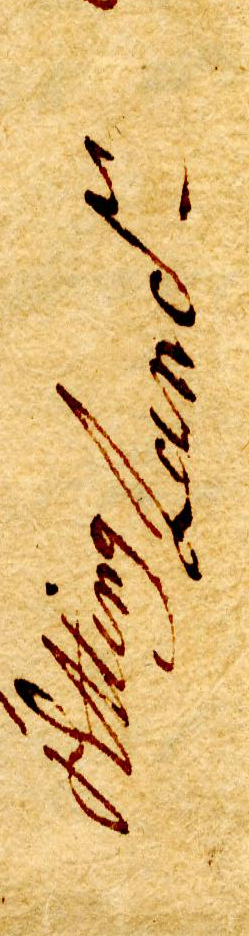Sitting land
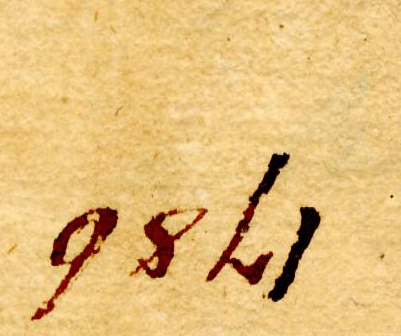1786
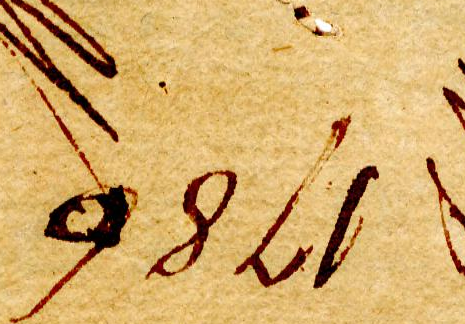1786
